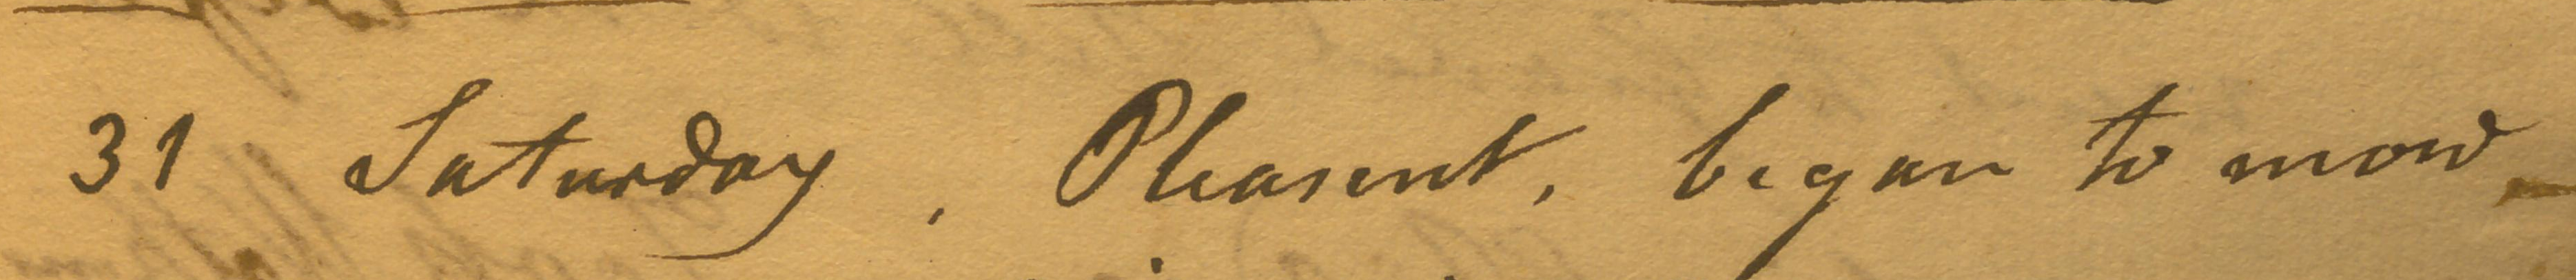31 Saturday Pleasent, began to mow
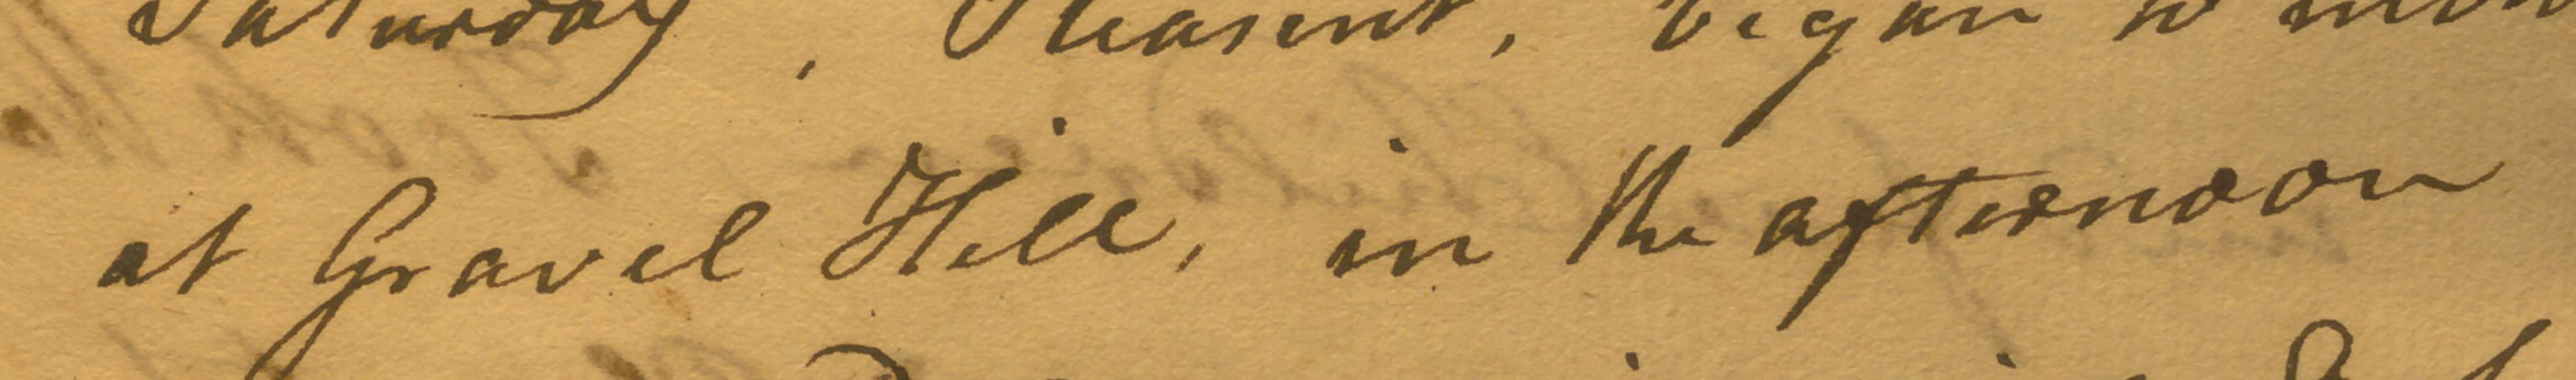at Gravel Hill, in the afternoon
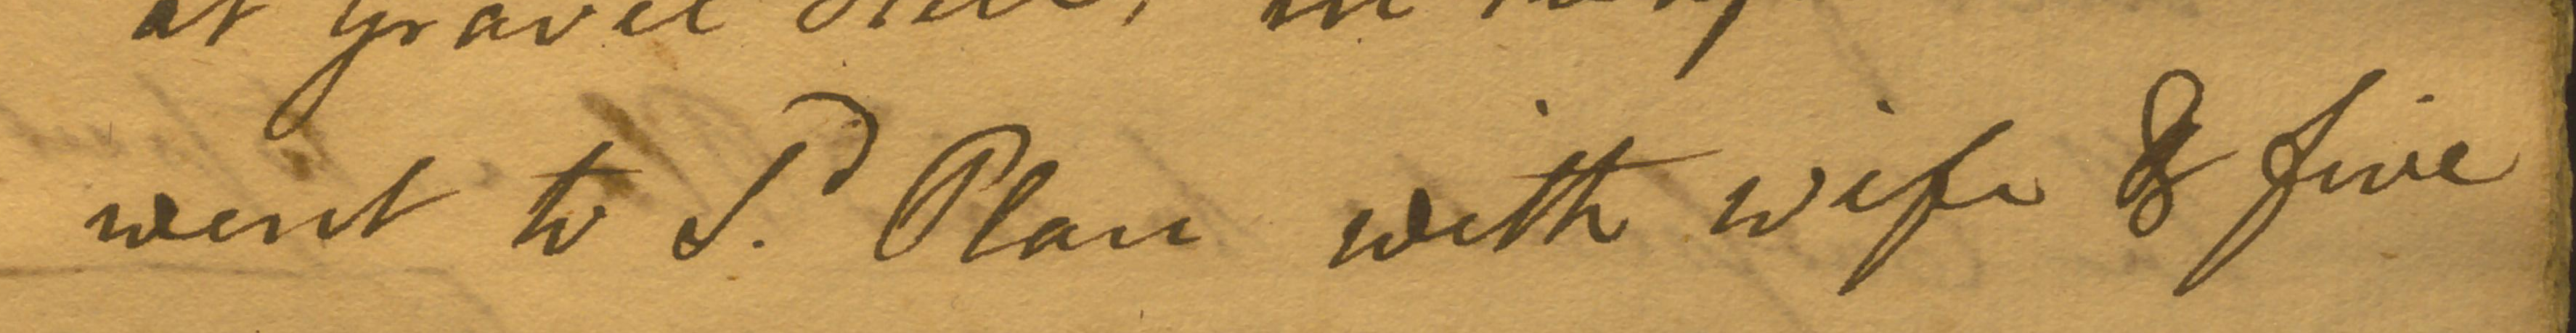went to s^d. Plan with wife & five
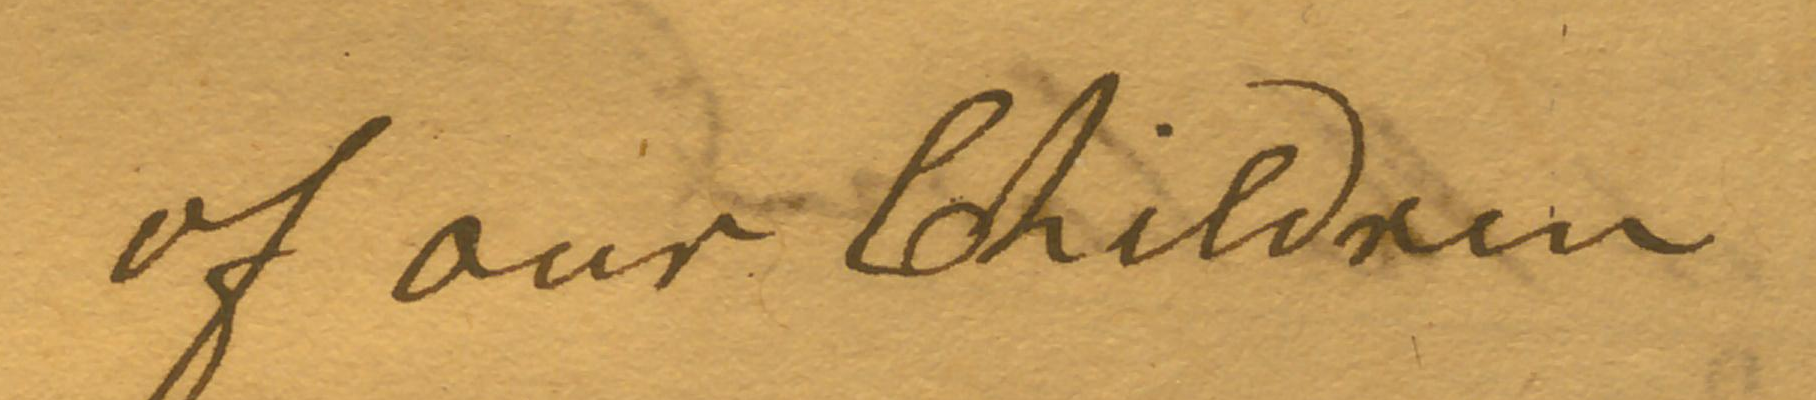of our Children
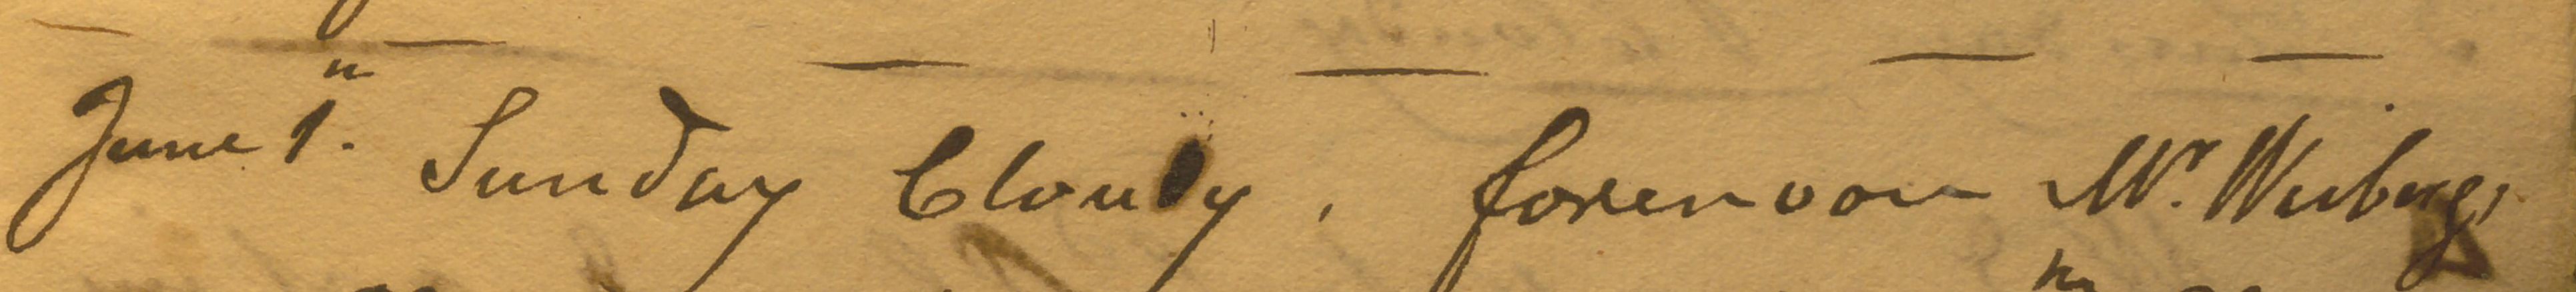June 1^th. Sunday Cloudy. forenoon M^r. Weibergs
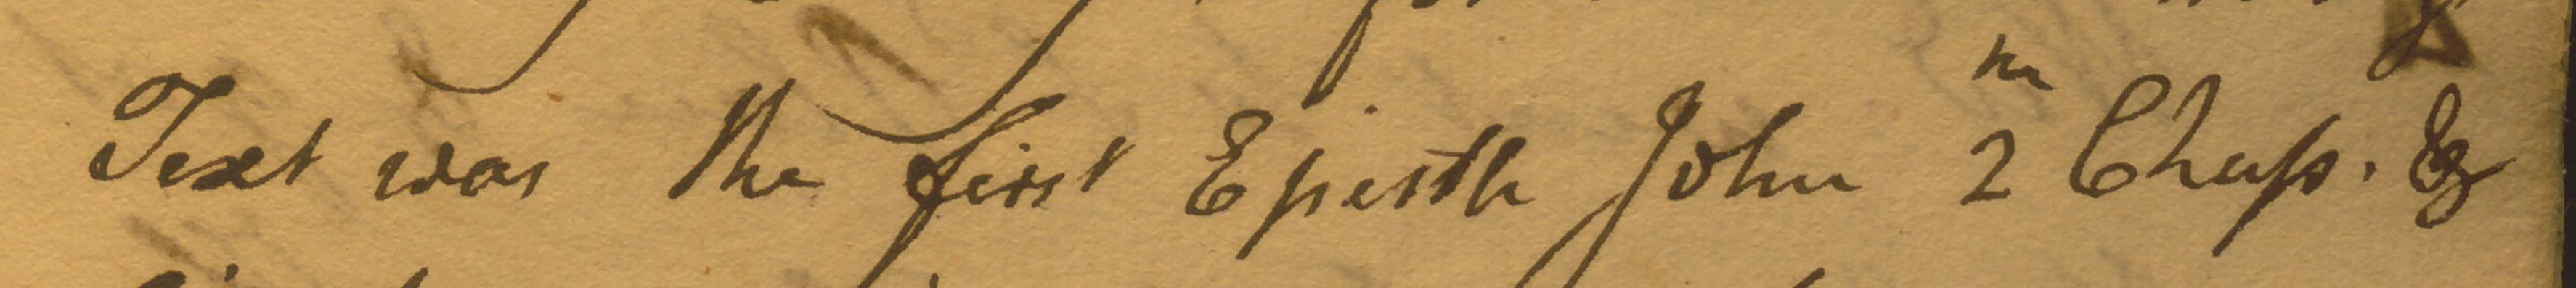Text was the first Epistle John 2^th Chap. &
